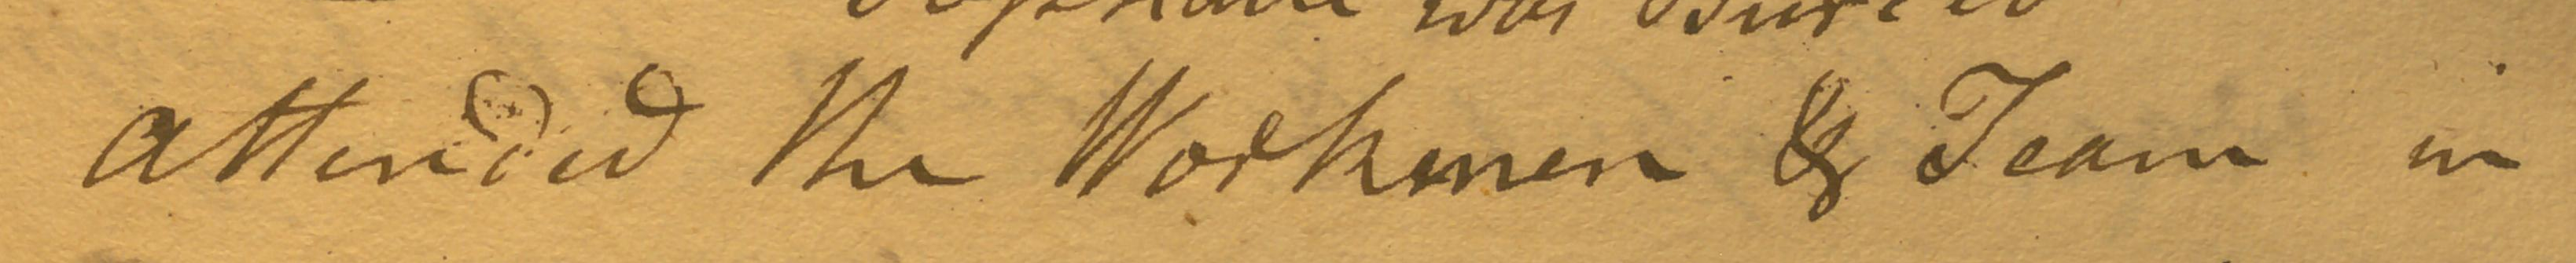attended the Workmen & Team in
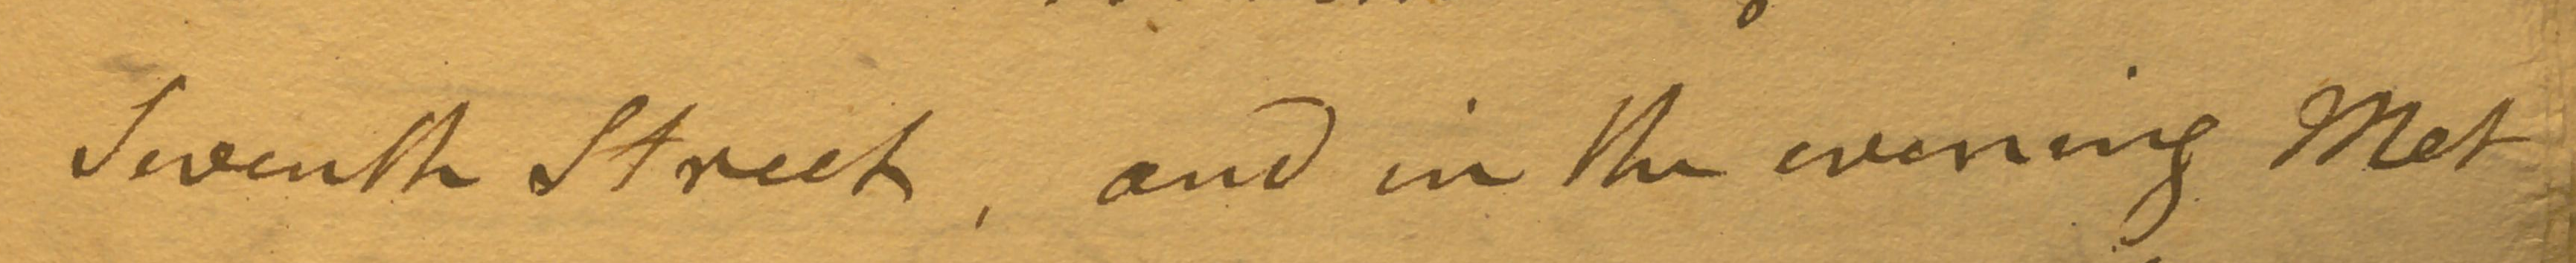Seventh Street and in the evening Met
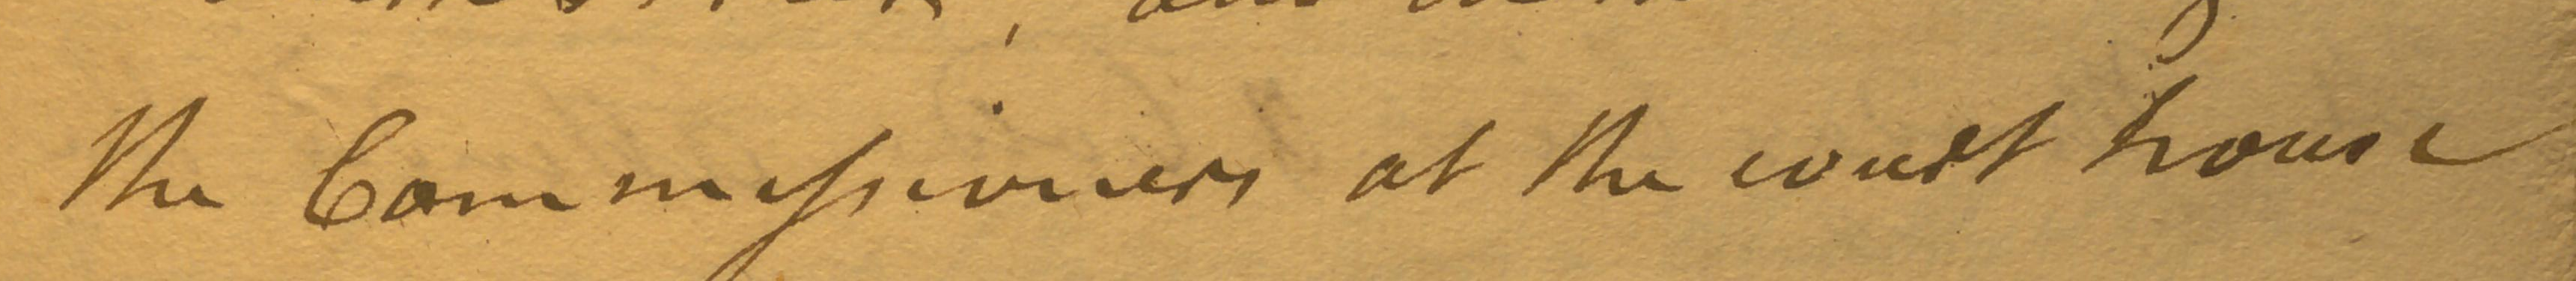the Commissioners at the court house
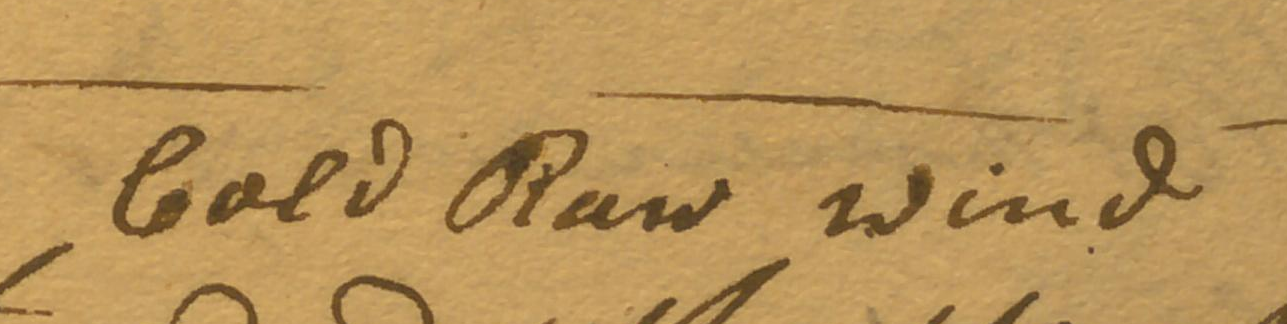Cold Raw wind
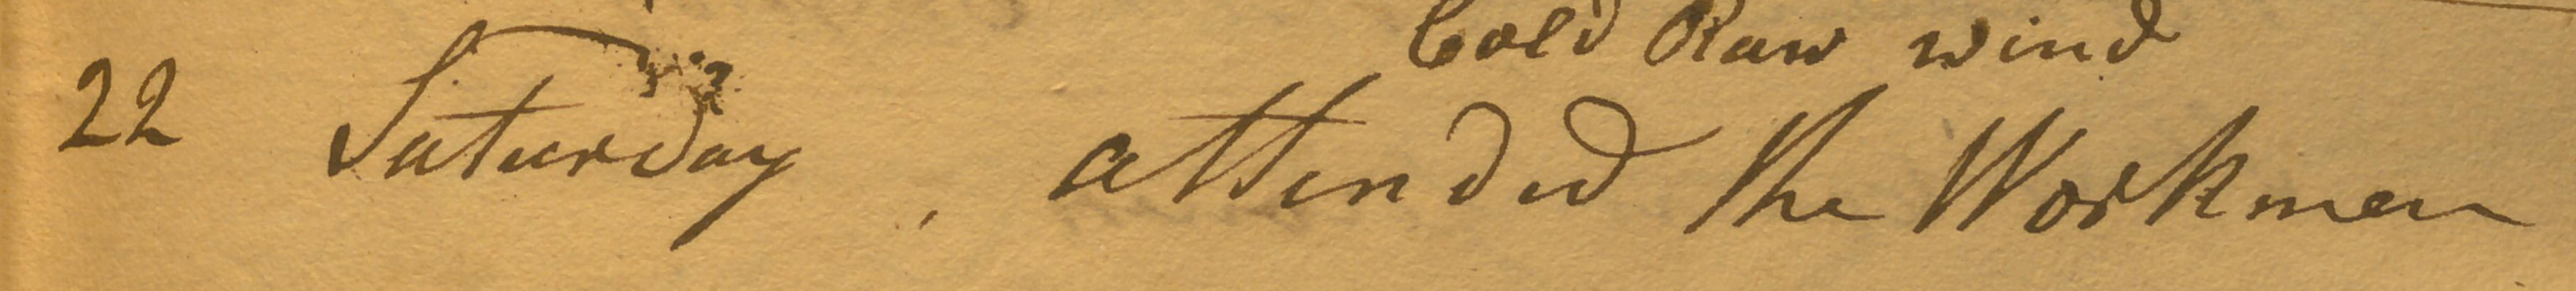22 Saturday attended the Workmen
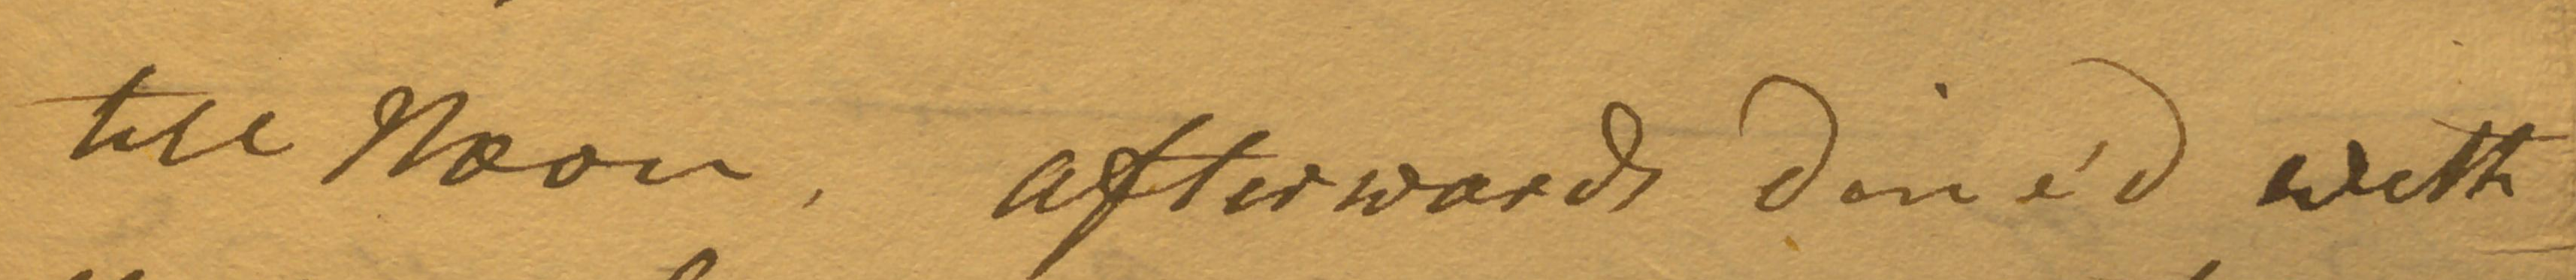till noon, afterwards dined with
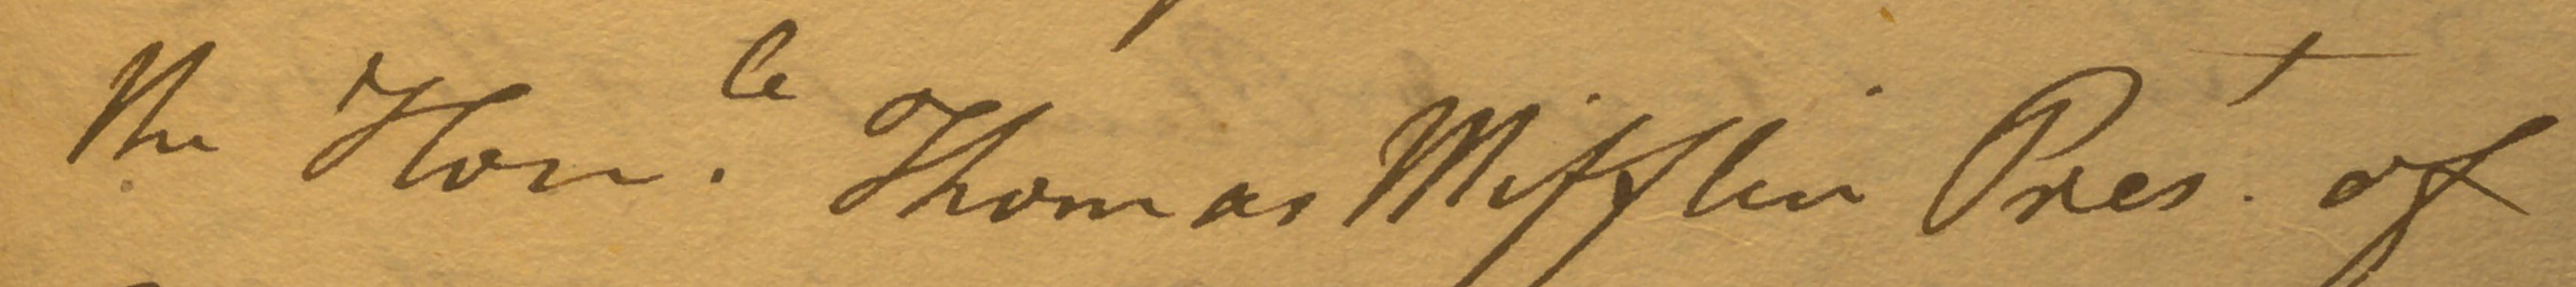the Hon^le. Thomas Mifflin Pres^t. of
